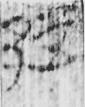○（正）
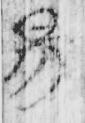昜（陽）
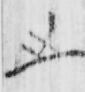之
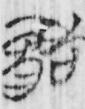酷
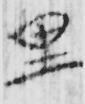里
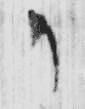人
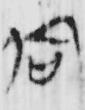卲
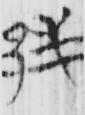○（求）
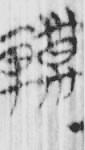○（獵）
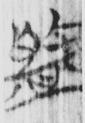盤
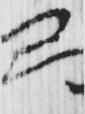己
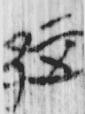○（正）
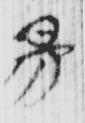昜（陽）
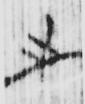之
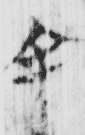牢
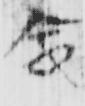{宀𠁩}
